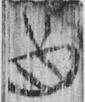貞？
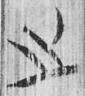之
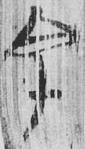宔（主）
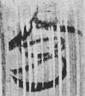宮
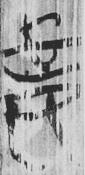妾
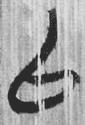㠯（以）
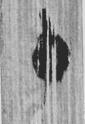十
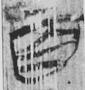百
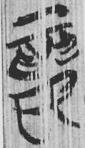數
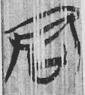君
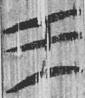王
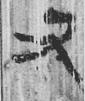又（有）
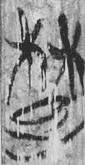楚
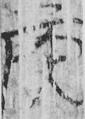侯
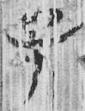子
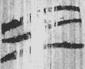三
